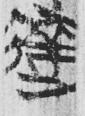○（失）
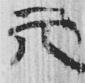亓
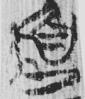道
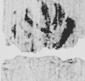出
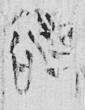欲
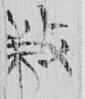殺
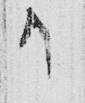人
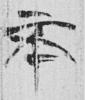不
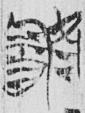○（飲）
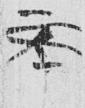不
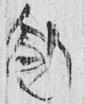○（食）
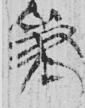秉
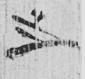之
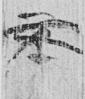不
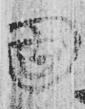固
